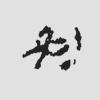利
